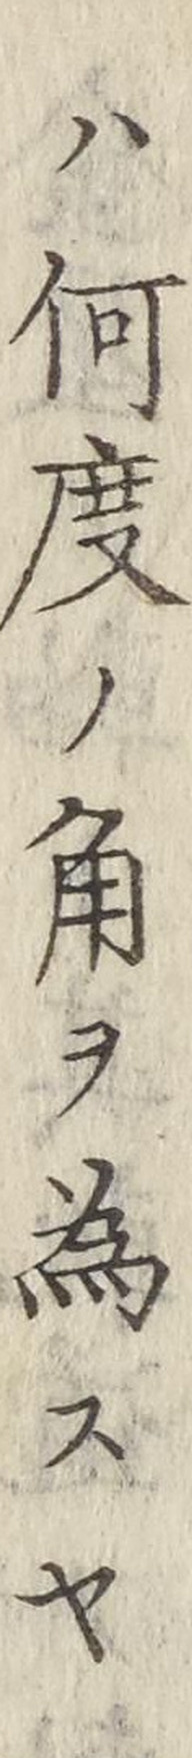ハ何度ノ角ヲ為スヤ
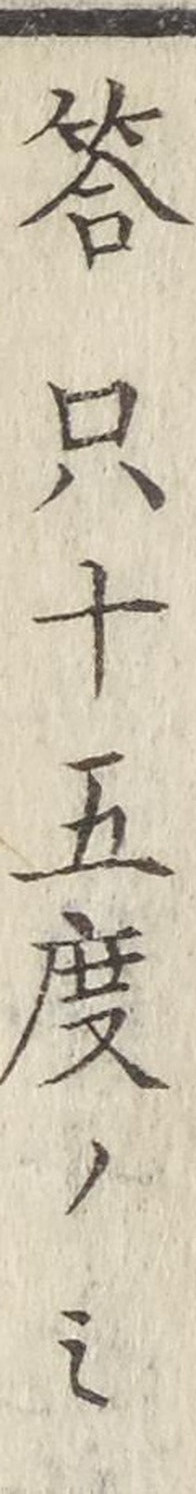答只十五度ノミ
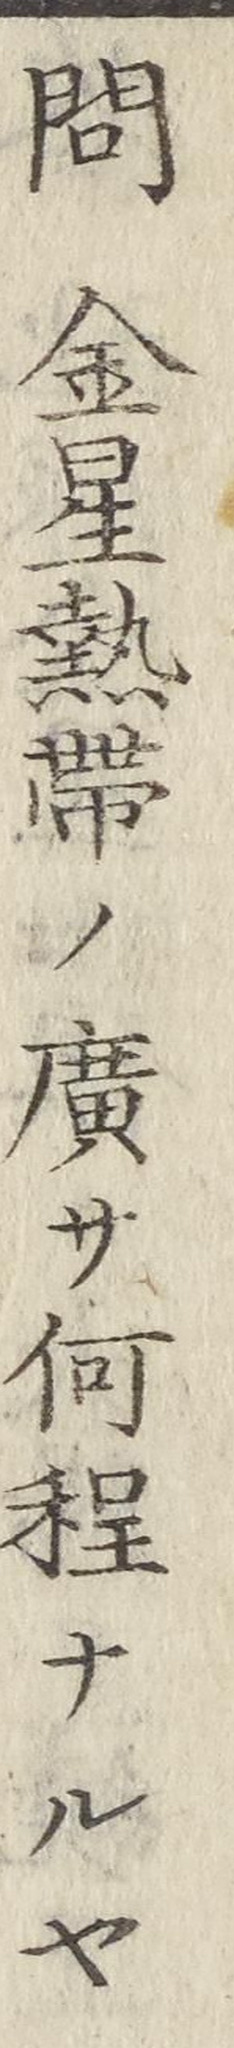問金星熱帯ノ広サ何程ナルヤ
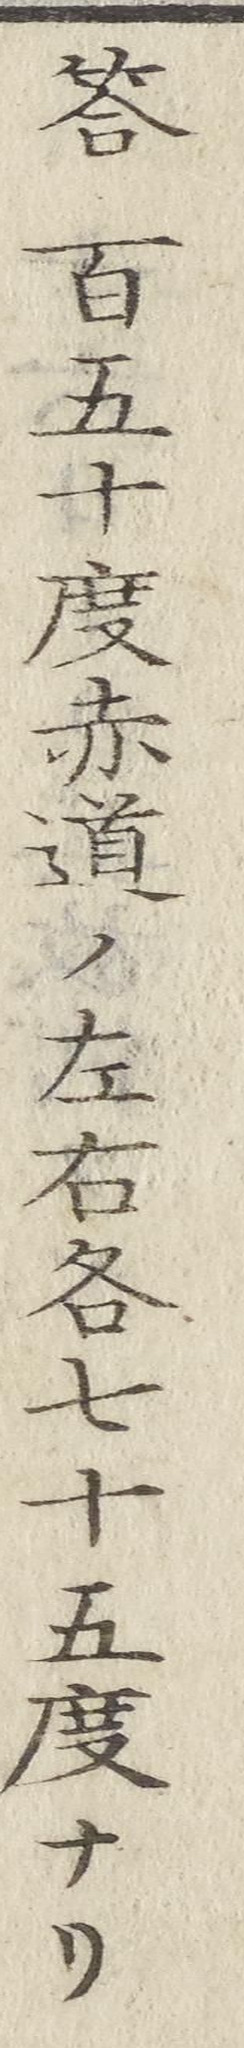答百五十度赤道ノ左右各七十五度ナリ
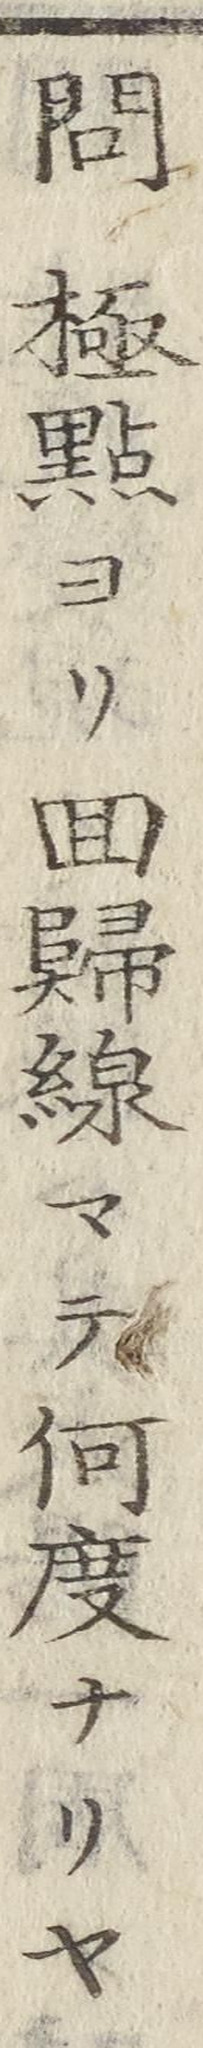問極点ヨリ回帰線マテ何度ナリヤ
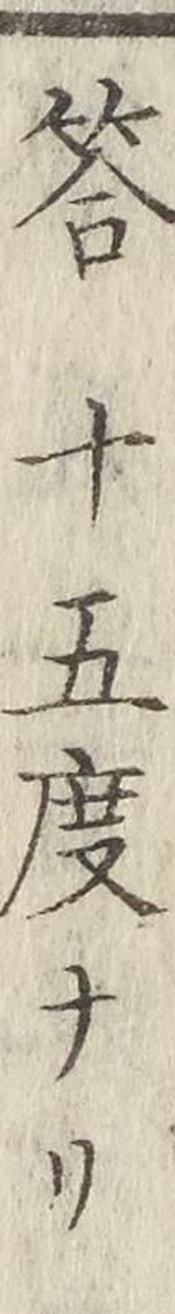答十五度ナリ
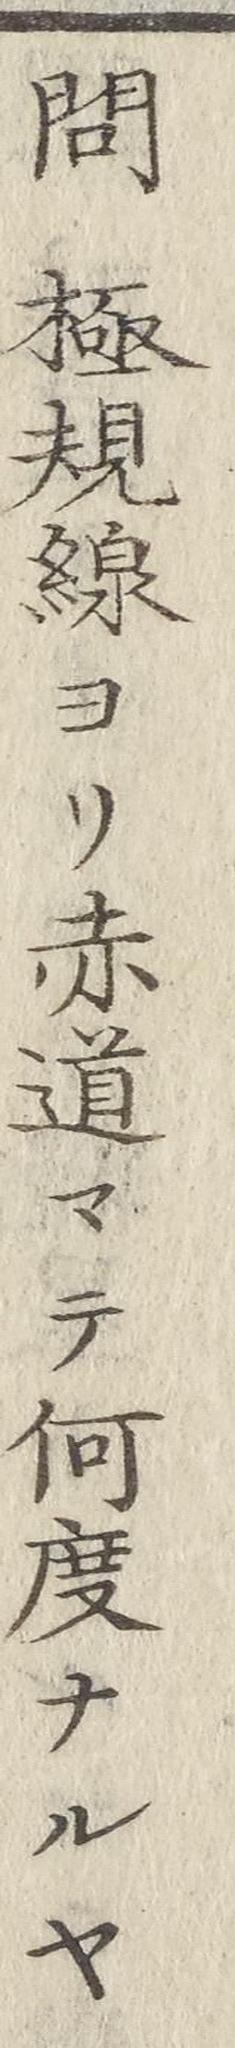問極規線ヨリ赤道マテ何度ナルヤ
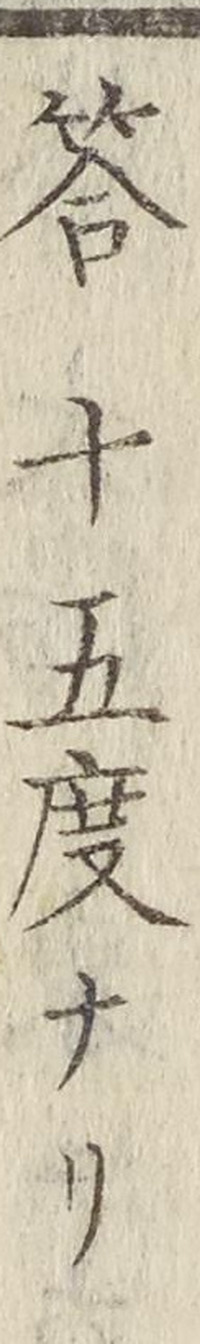答十五度ナリ
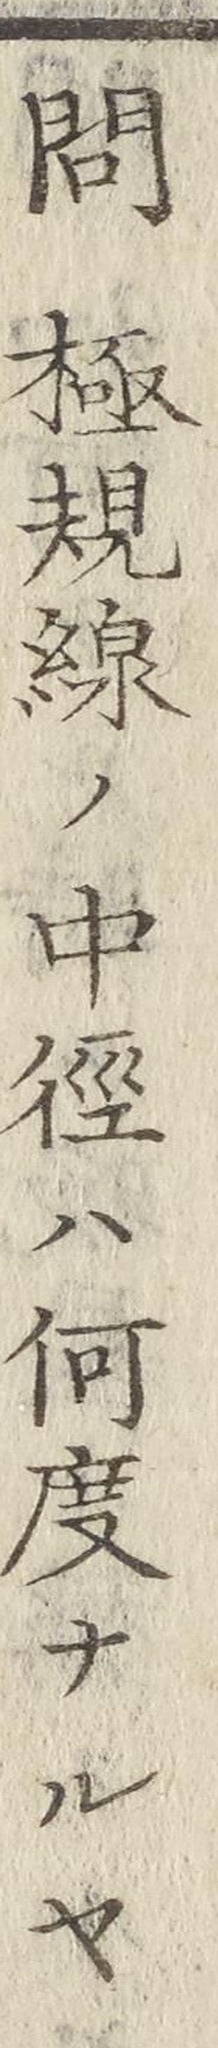問極規線ノ中径ハ何度ナルヤ
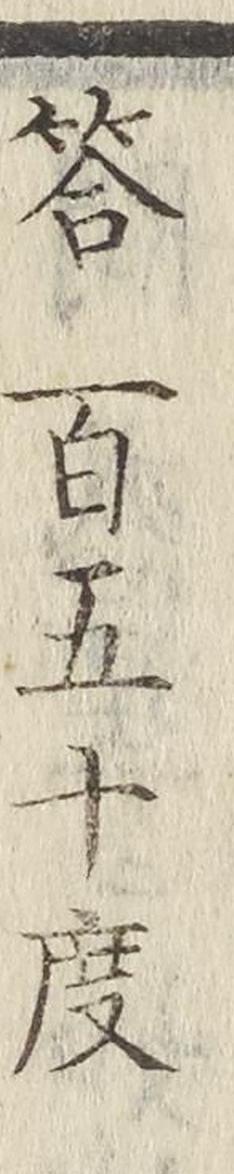答百五十度
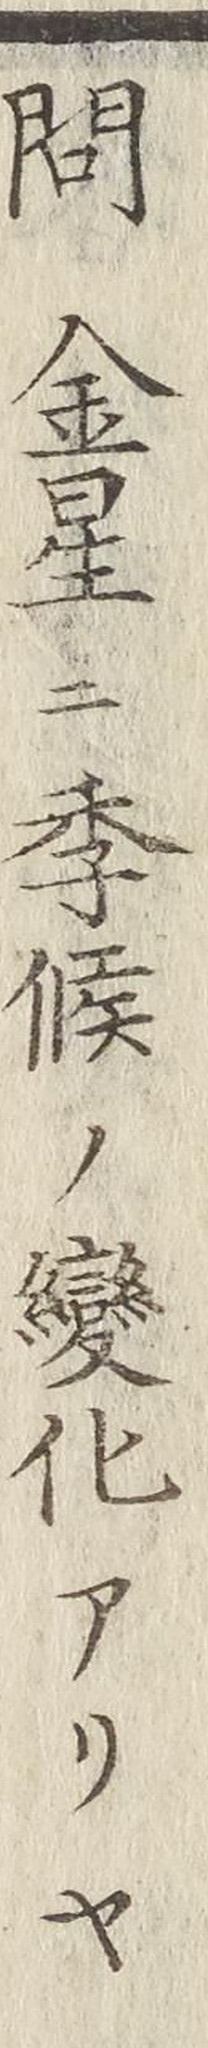問金星ニ季候ノ変化アリヤ
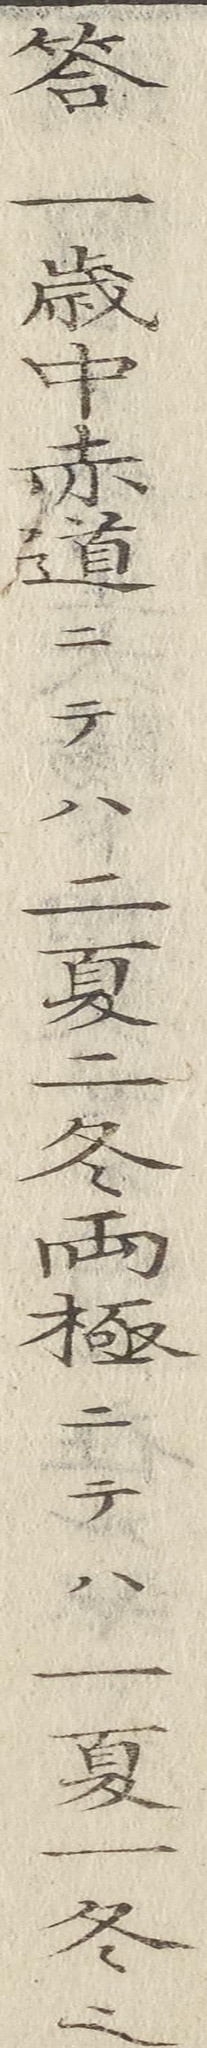答一歳中赤道ニテハ二夏二冬両極ニテハ一夏一冬也
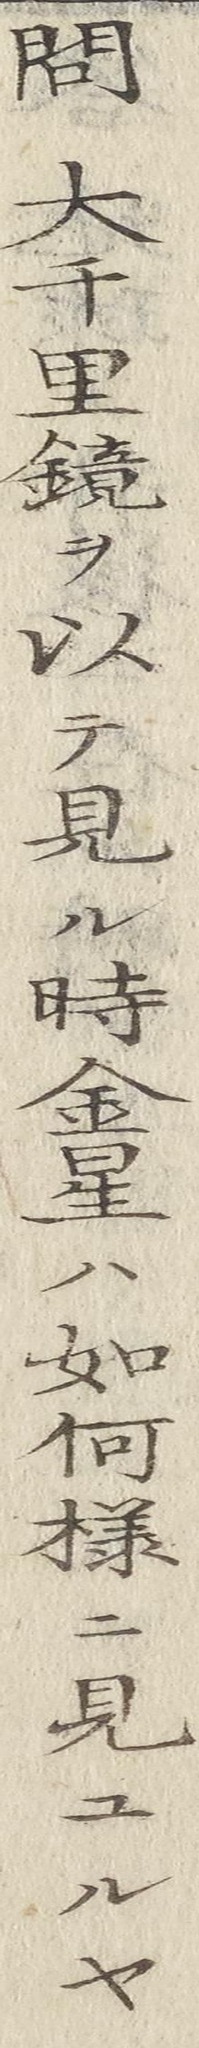問大千里鏡ヲ以テ見ル時金星ハ如何様ニ見ユルヤ
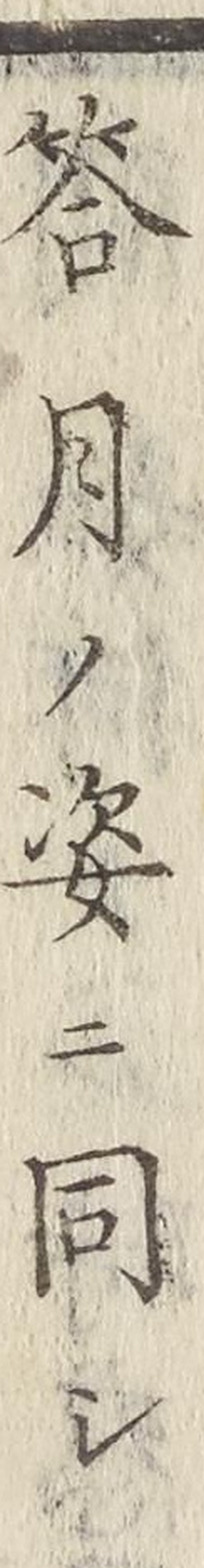答月ノ姿ニ同シ
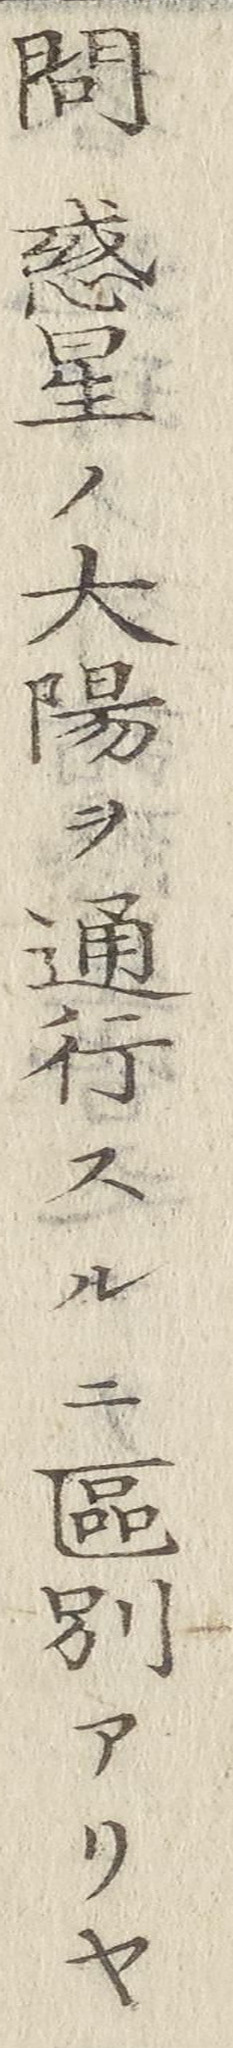問惑星ノ大陽ヲ通行スルニ区別アリヤ
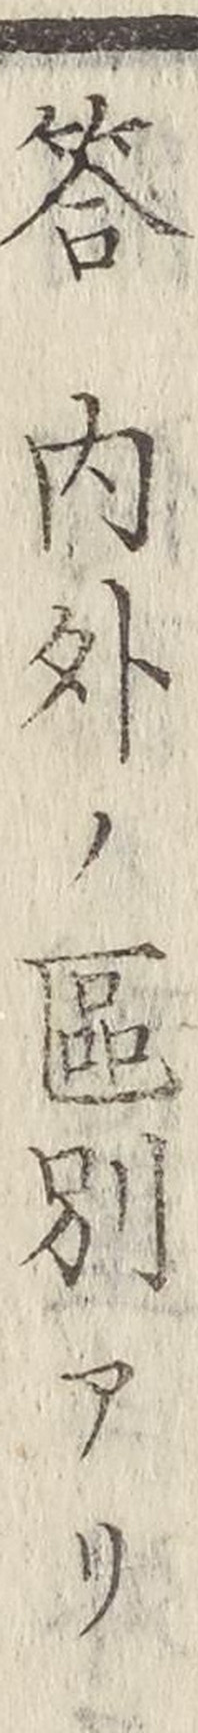答内外ノ区別アリ
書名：星学圖説　上
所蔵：東京大学地震研究所図書室 Earthquake Research Institute Library, The University of Tokyo, JAPAN
